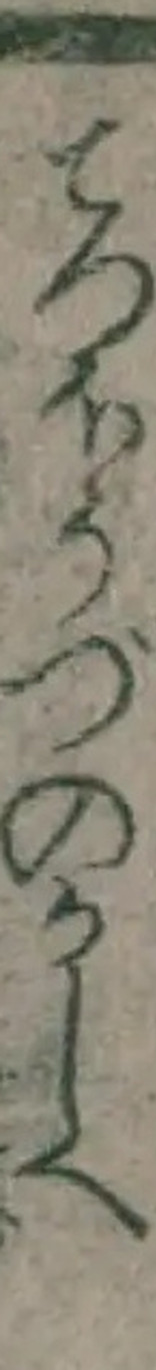てつほうづのかしへ
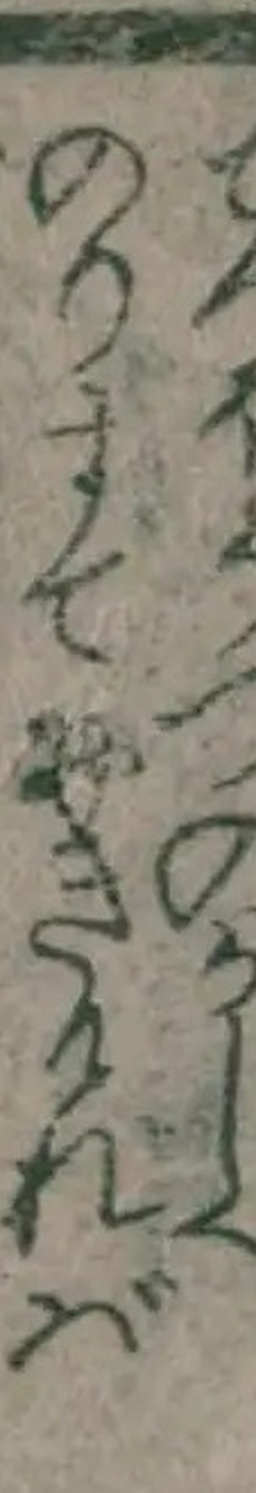のりすておきければ
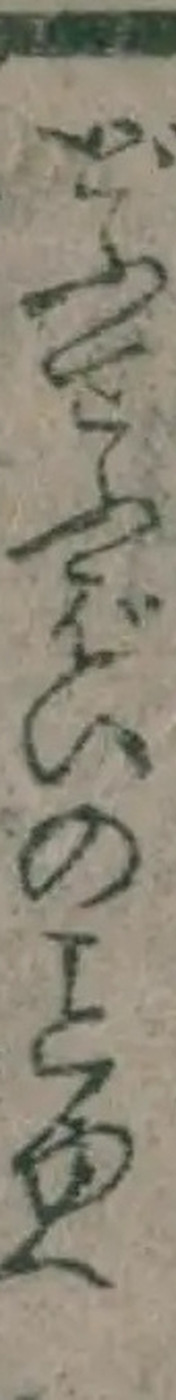どうふせふばいのことゆへ
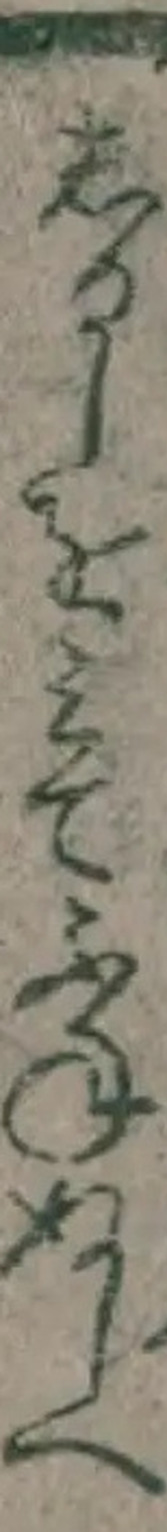しるしをみてふねぬしへ
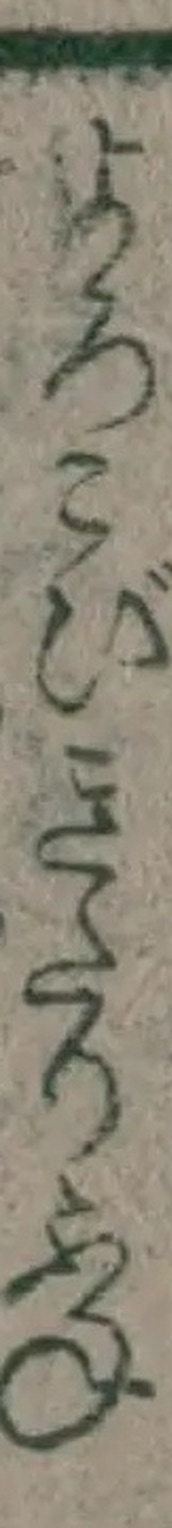よろこびきたりふね
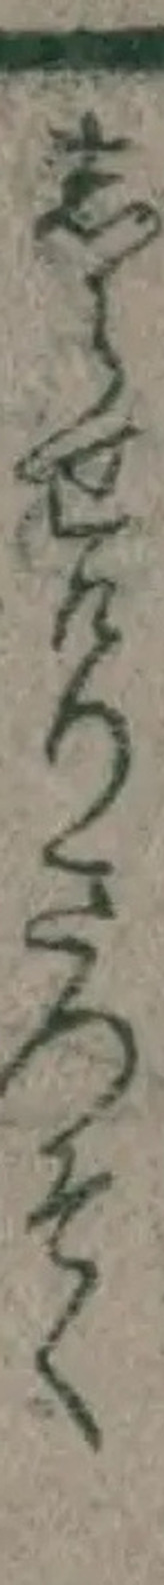しらせけりさつそく
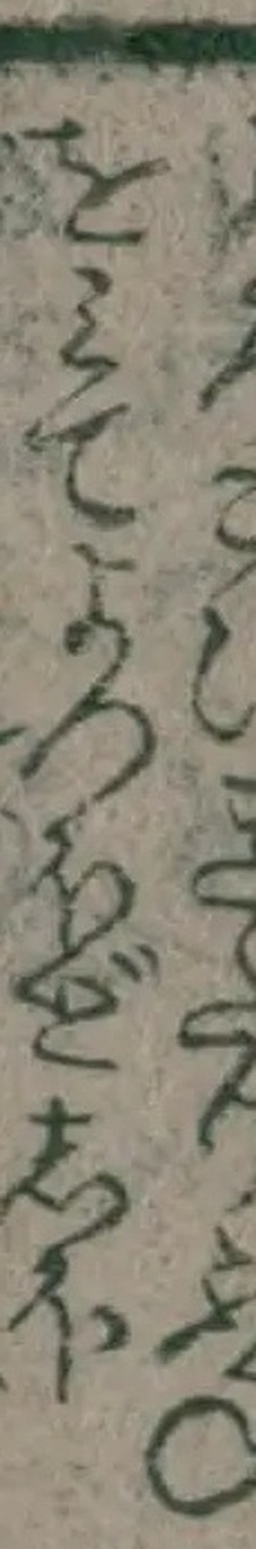をみてよつほどしほ
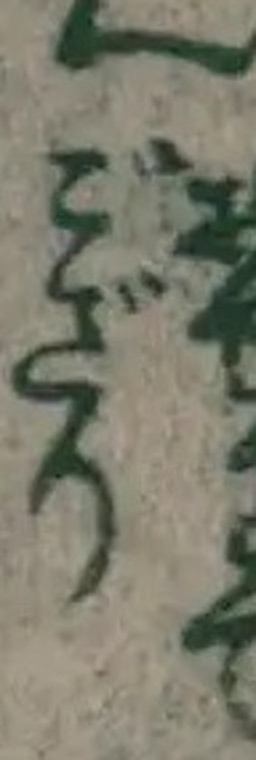ござり
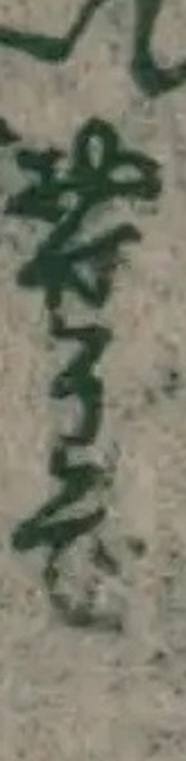おせわで
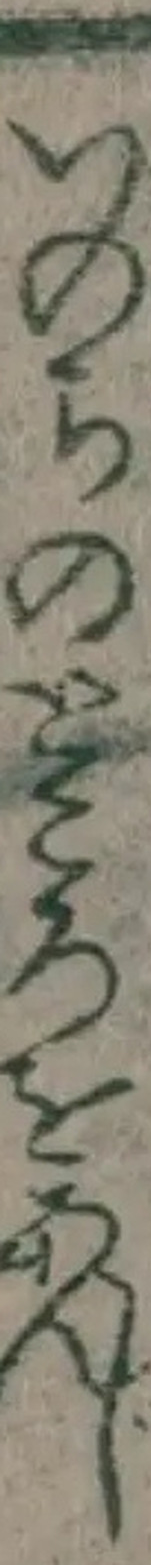いのちのところをあんじ
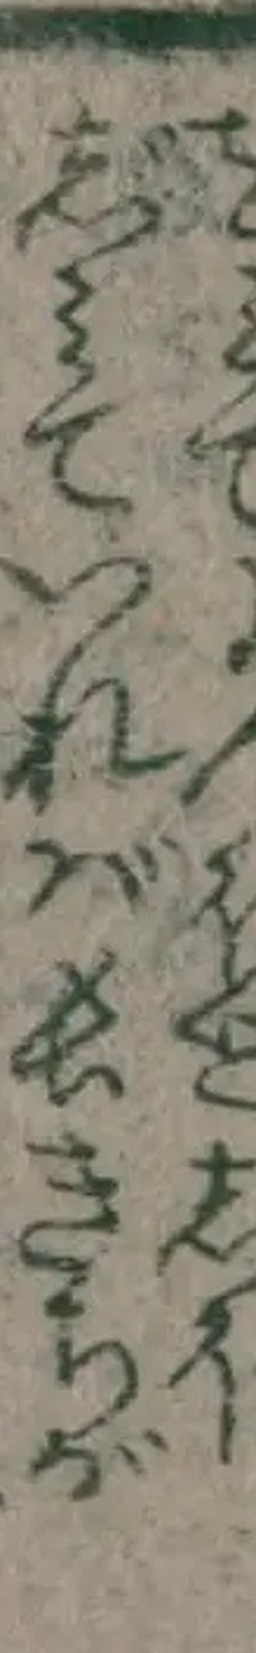じみていれば長きちが
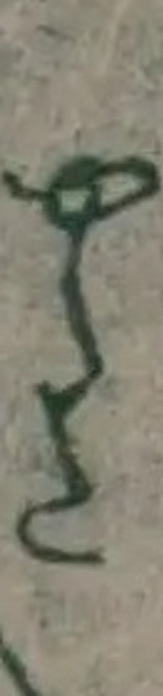やした
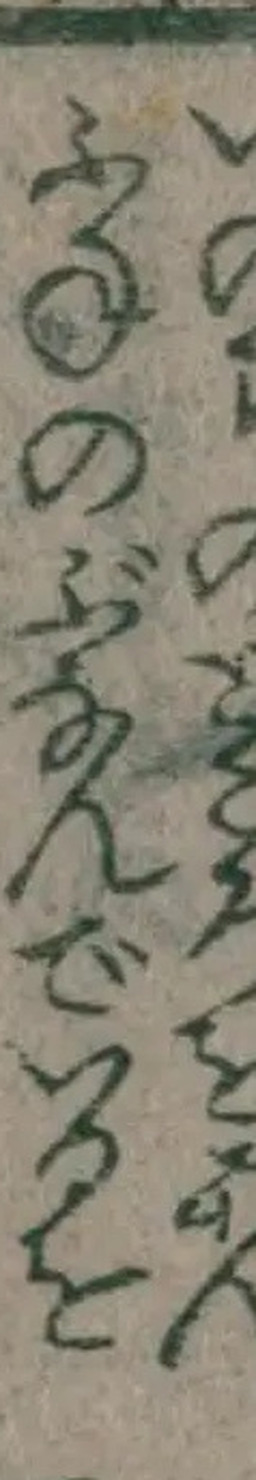ふねのぶなんでいるを
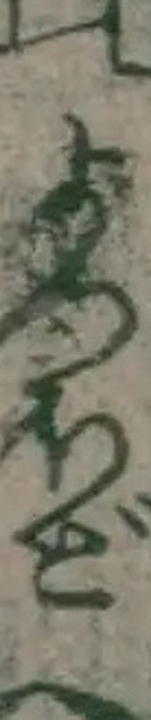よつほど
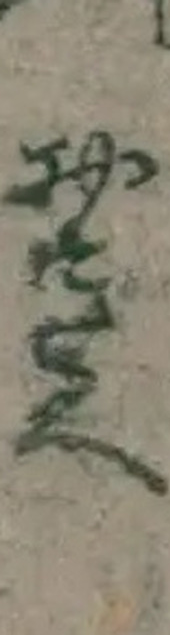おきへ
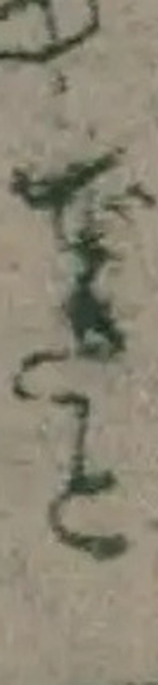でたと
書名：縦筒放唐の噺 3巻
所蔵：国立国会図書館 National Diet Library, JAPAN
